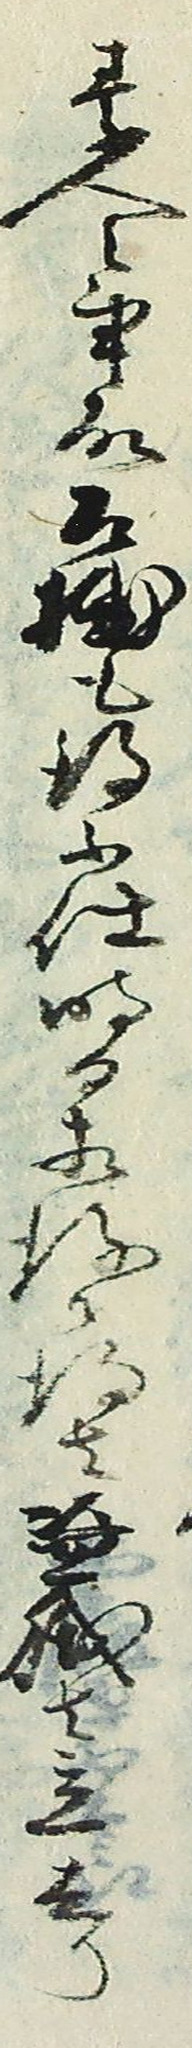素人之事故召捕も得不仕時日相後候得者盗賊者立去り
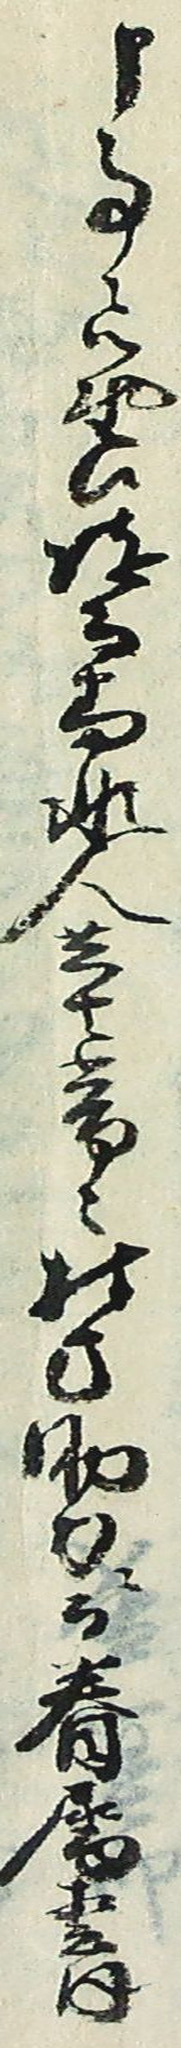申事ニ御坐候隨而番非人共者常々村方助力ニ而眷属相育
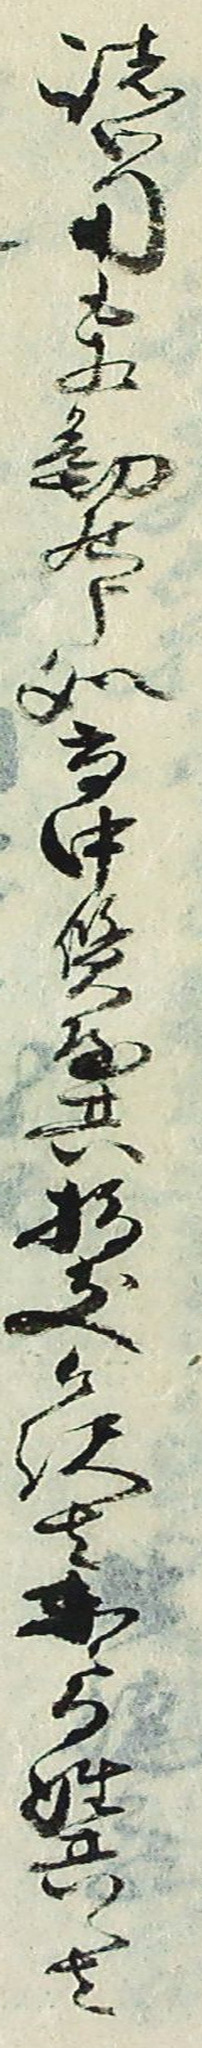諸御用も相勤居申処市中質屋共指支候訳者末々百姓共へ者
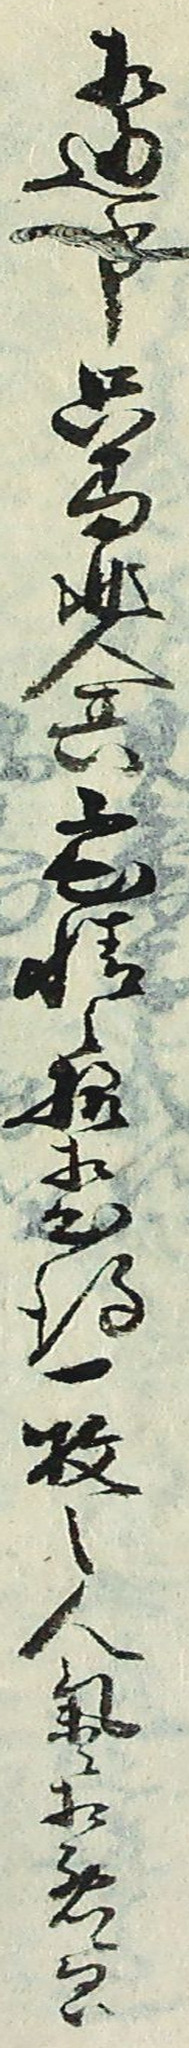相通不申只番非人共不出精之様相心得一牧之人気ニ相悪候而ハ
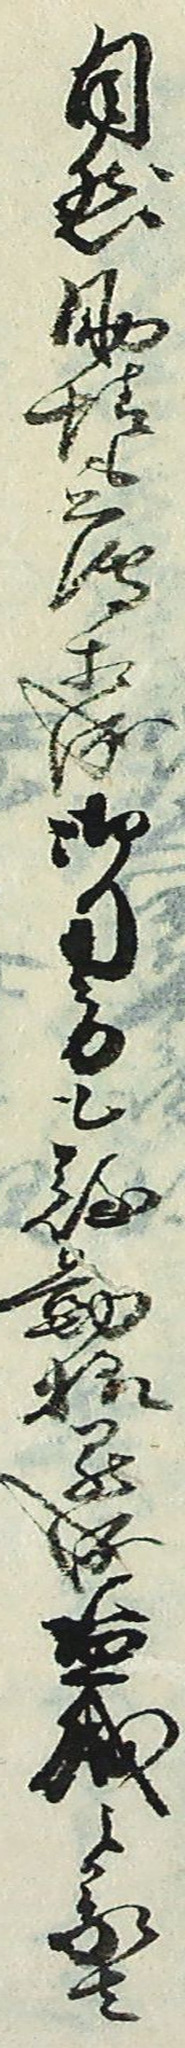自然助情も薄相成御用方も難勤様罷成盗賊之義者
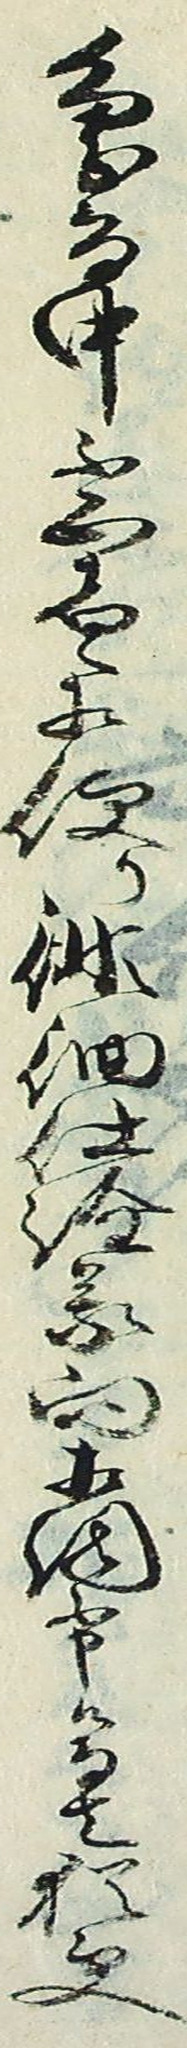多分市中不正者へ相便り徘徊仕詮義向相調不申候而者猶更
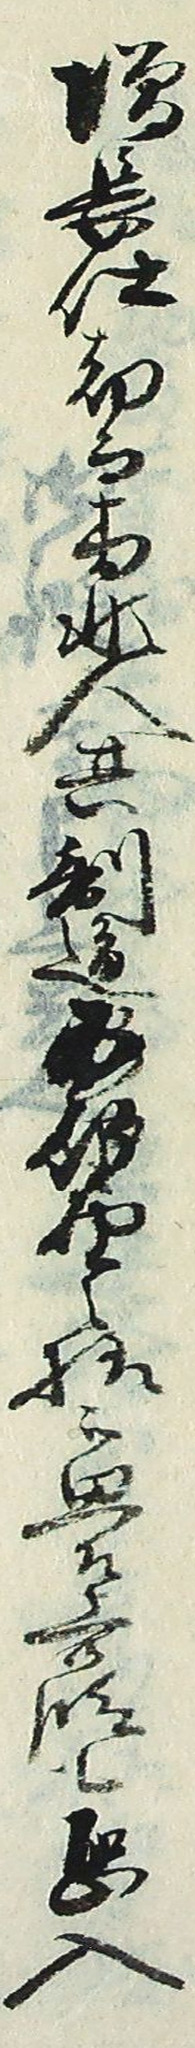増長仕却而番非人共制道不行届之様被思召上候段も恐入
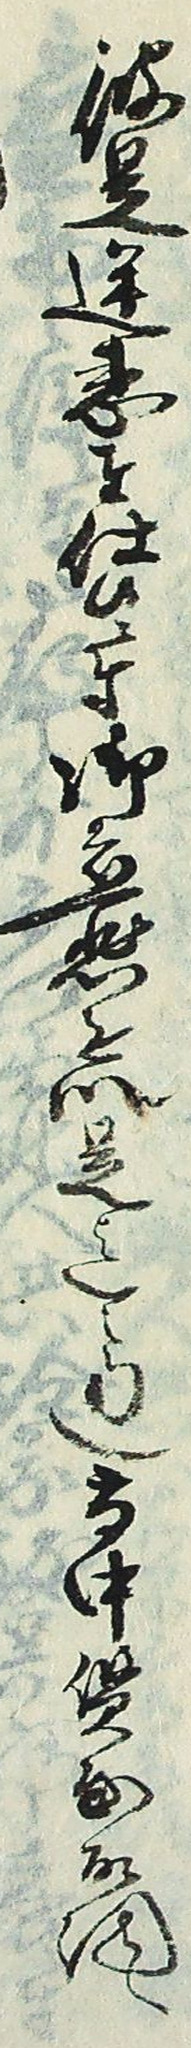彼是迷惑奉仕候ニ付御慈悲を以是迄之通市中質屋取調へ
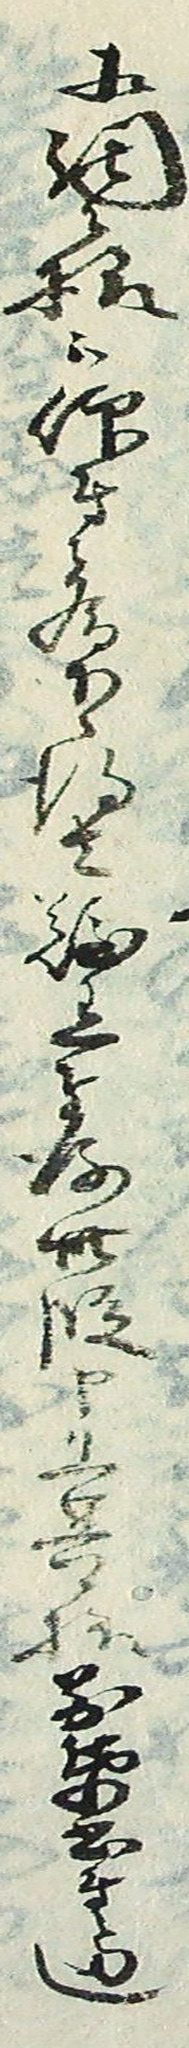相調候様被仰付被為下候得者難有奉存此段申上呉候様別帋書付之通
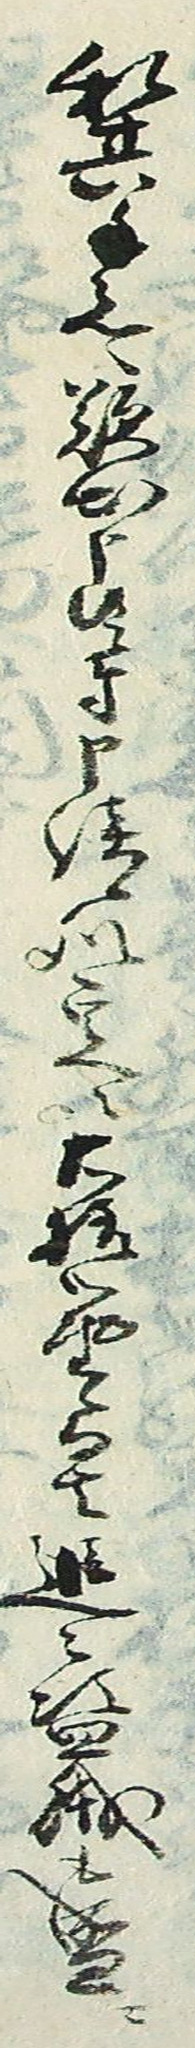私共手元へ歎出申候ニ付申談候処実ニ右様御坐候而者追々盗賊も盛ニ
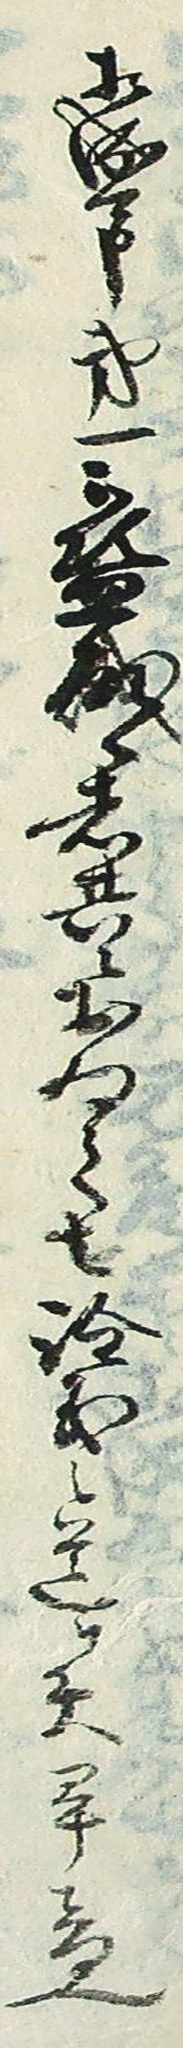相成可申第一被盗賊候者共ニおゐて者詮義之道ヲ失畢竟
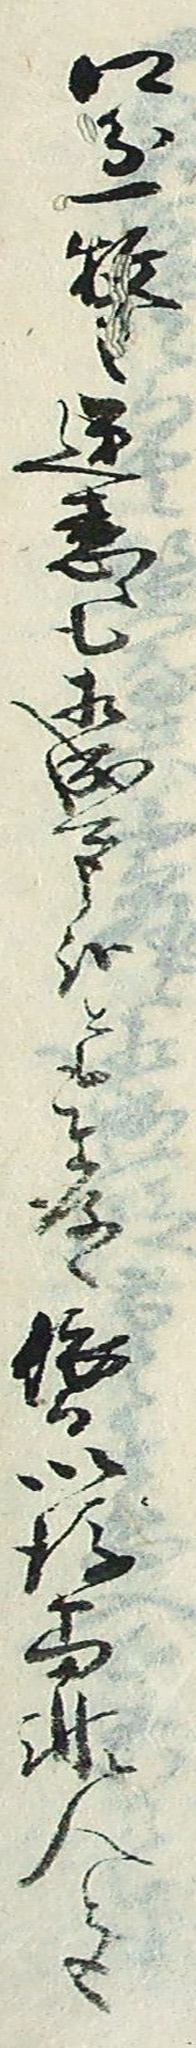郷分一牧之迷惑ニも相成可申哉とも奉存候依而以後番非人とも

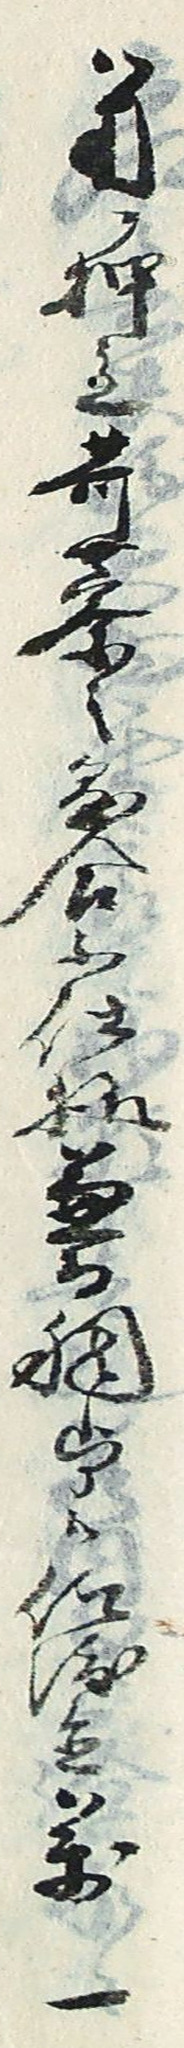御用ヲ立苛察之懸合不仕様兼而稠布被仰渡置萬一
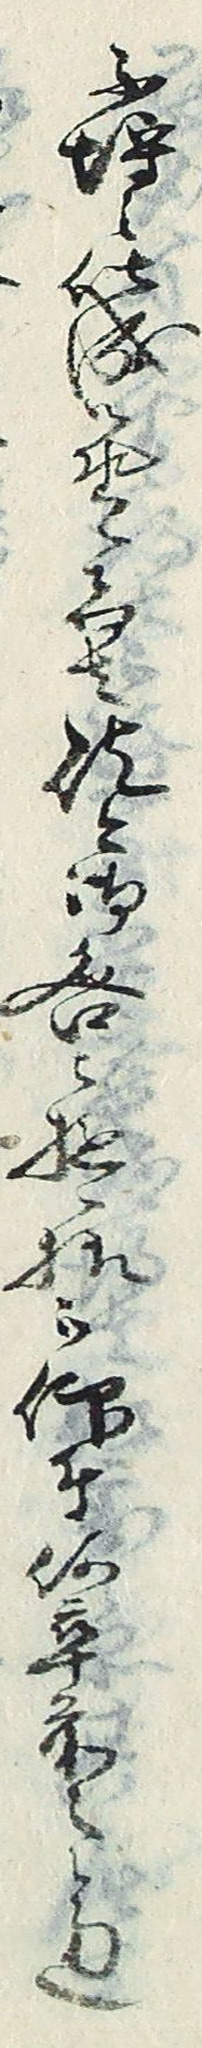不埒之仕成御坐候者者然と御咎被遊候様被仰付何卒前々之通
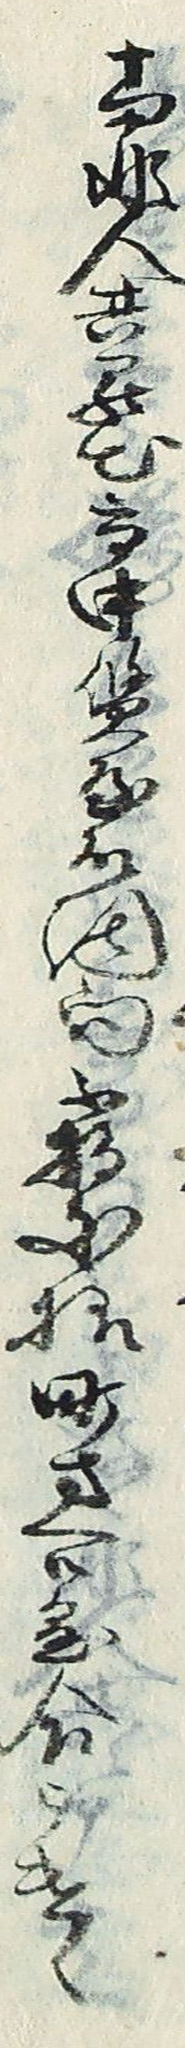番非人共罷出市中質屋取調向不指支様町方へ御懸合被遣候
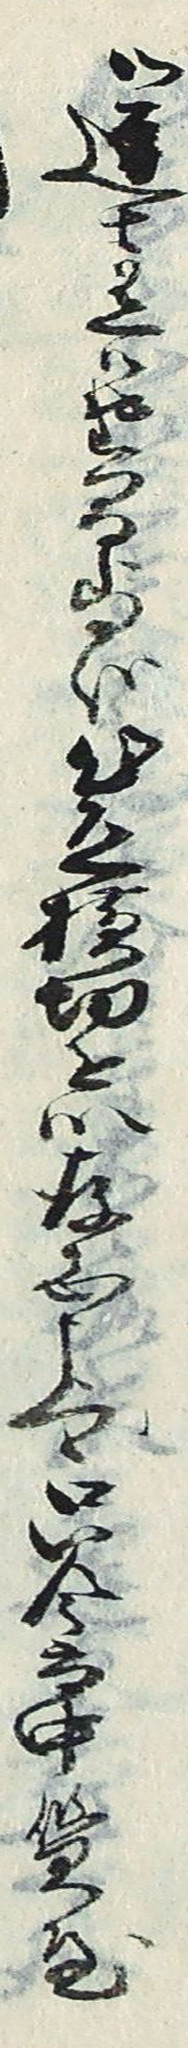御達者御意御座間布哉乍恐横切を以存念申上候只今市中質屋
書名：市郷質屋株御取究並御書出御趣法之写
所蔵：鳴門教育大学 Naruto University of Education
